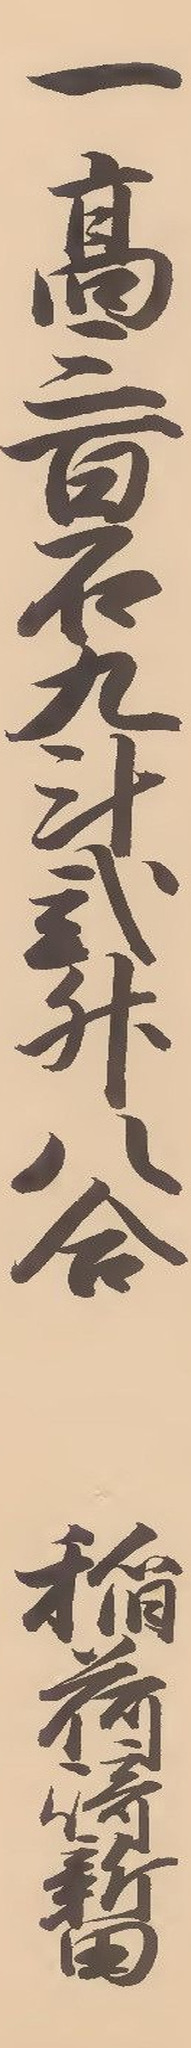一高三百石九斗弐升八合稲荷崎新田
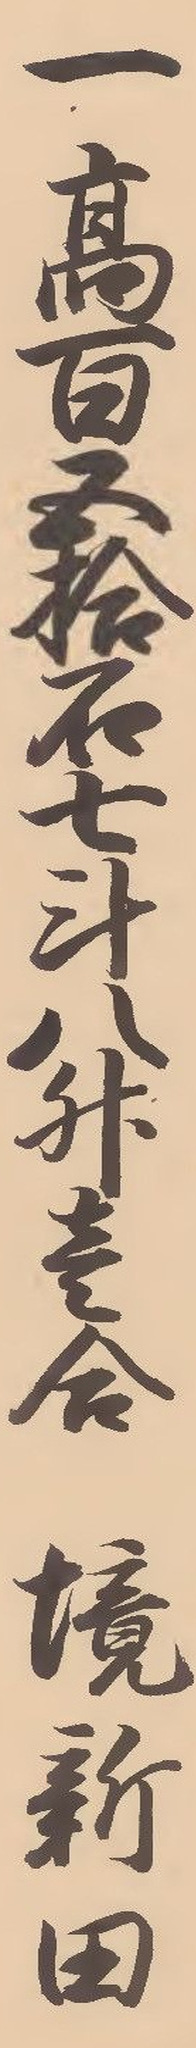一高百五拾石七斗八升壱合境新田
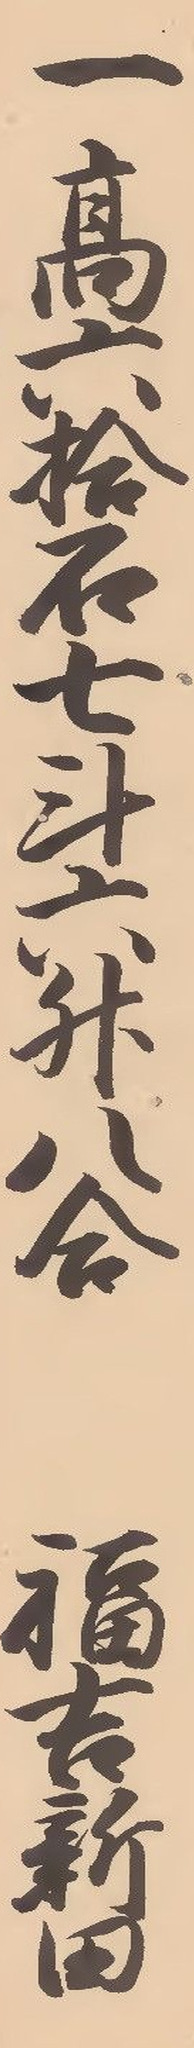一高六拾石七斗六升八合福吉新田
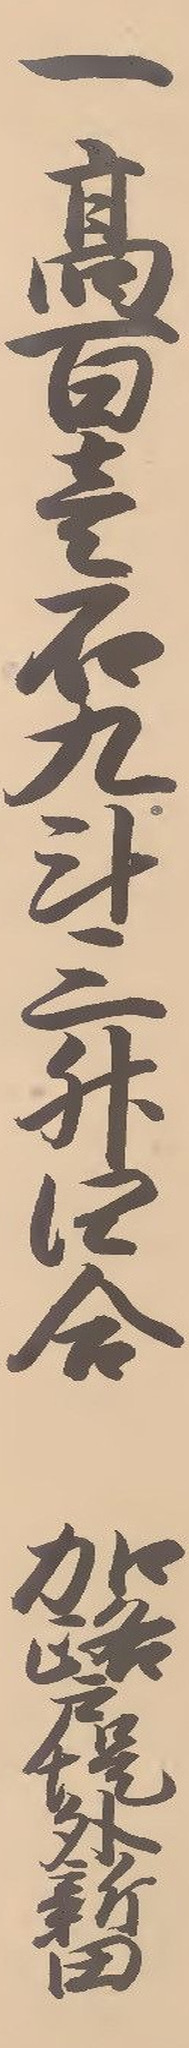一高百壱石九斗三升四合加路戸堤外新田
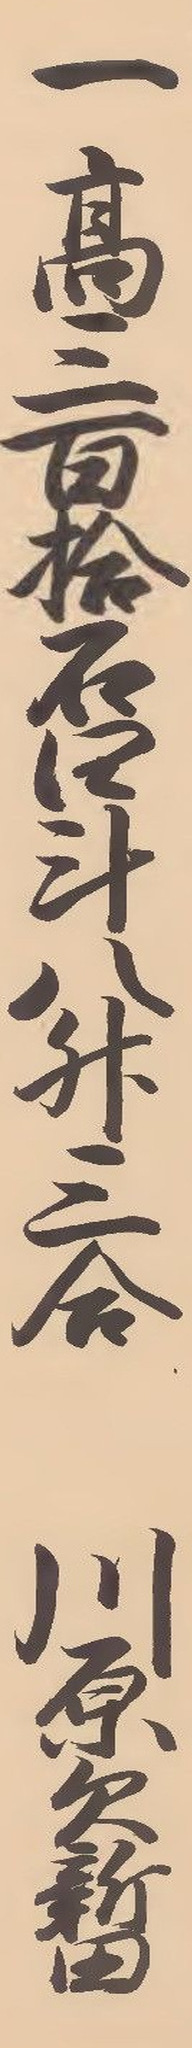一高三百拾石四斗八升三合川原欠新田
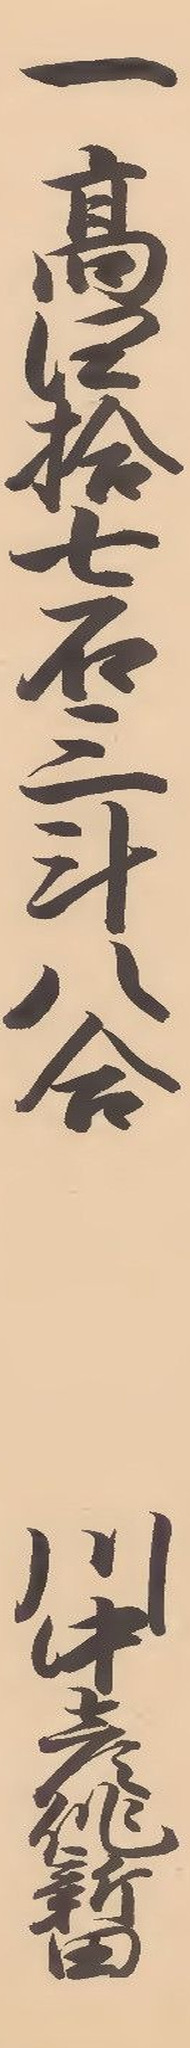一高四拾七石三斗八合川中彦作新田
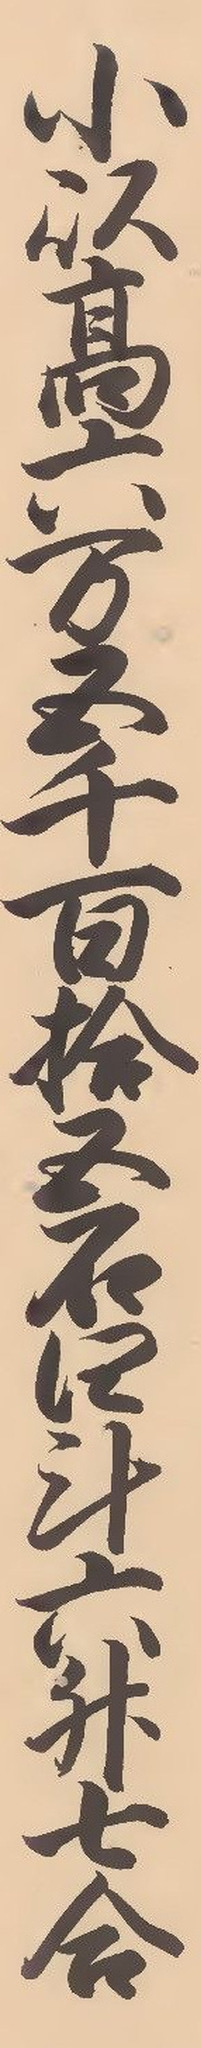小以高六万五千百拾五石四斗六升七合

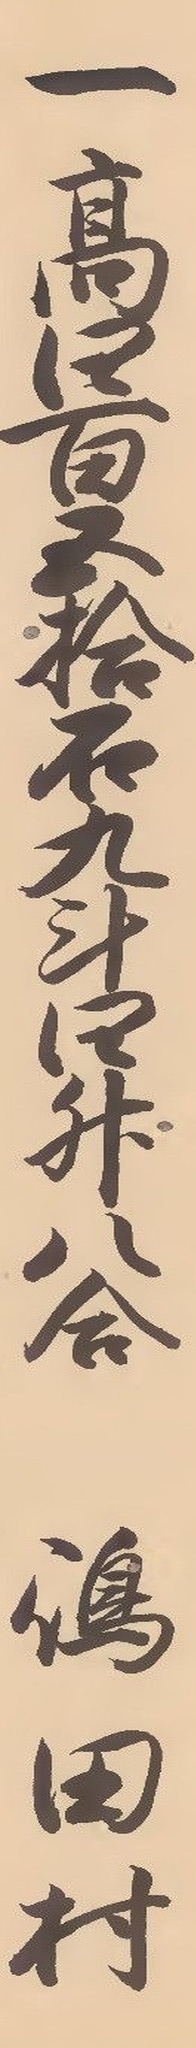一高四百五拾石九斗四升八合嶋田村
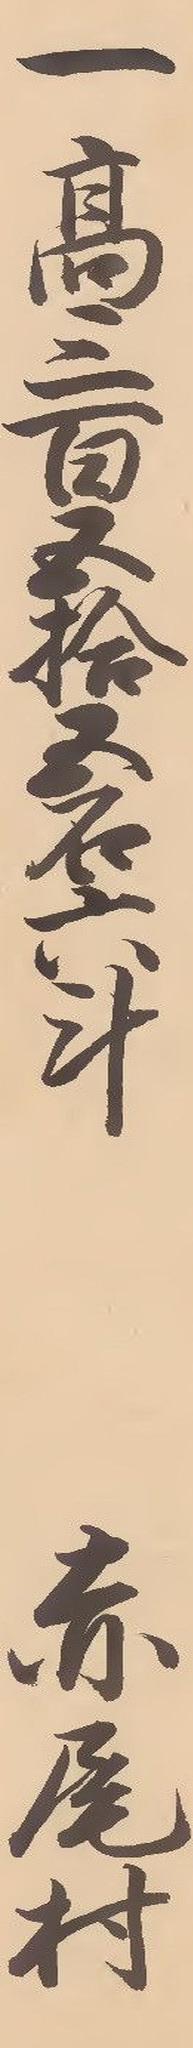一高三百五拾五石六斗赤尾村
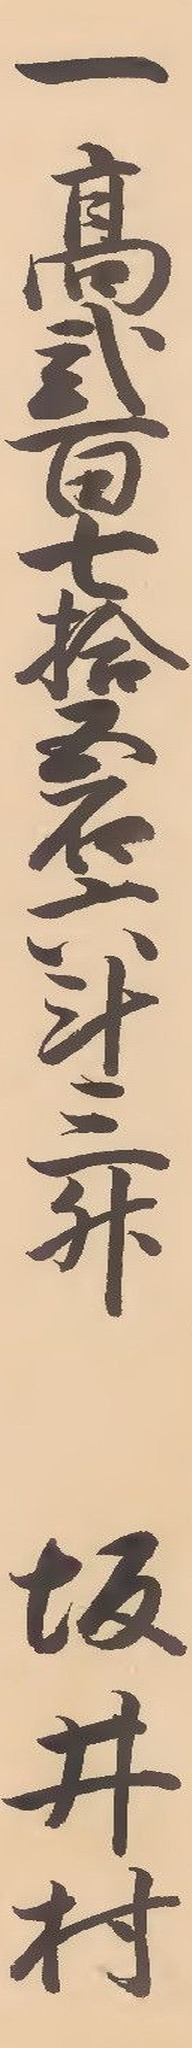一高弐百七拾五石六斗三升坂井村
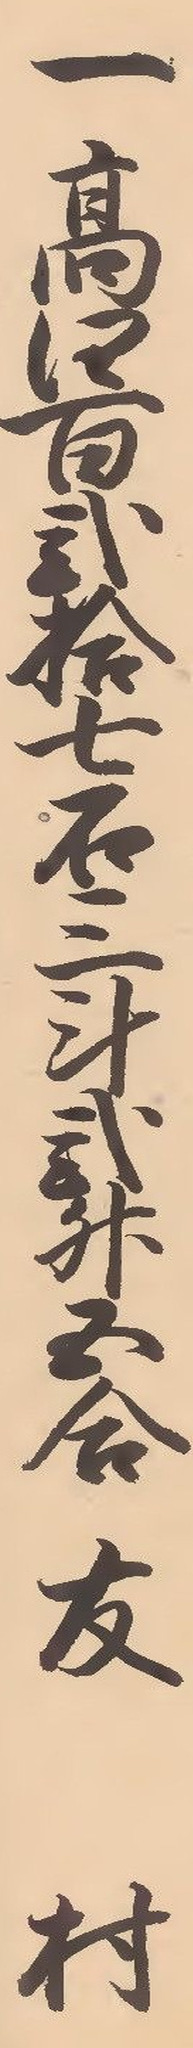一高四百弐拾七石三斗弐升五合友村
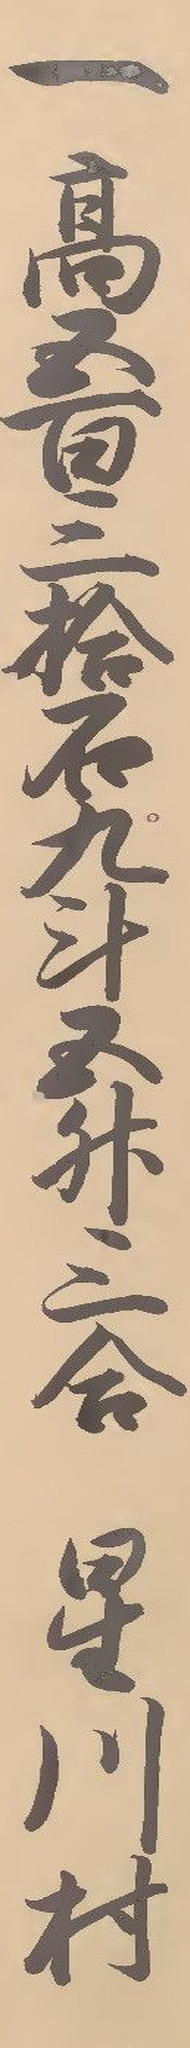一高五百三拾石九斗五升三合星川村
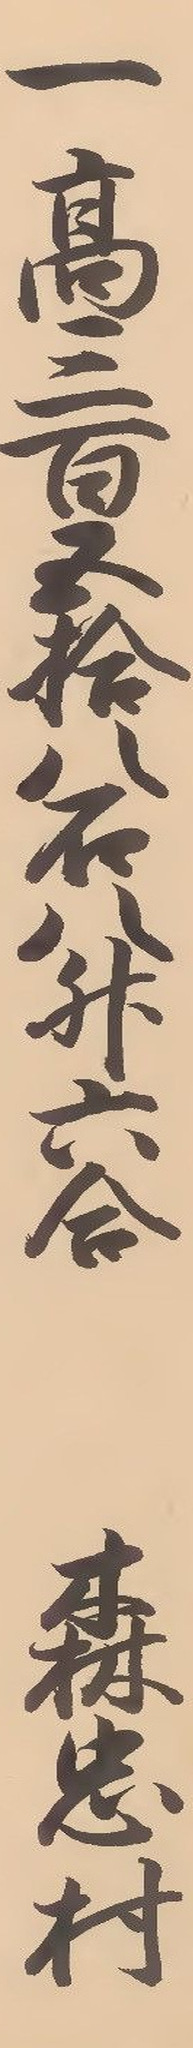一高三百五拾八石八升六合森忠村
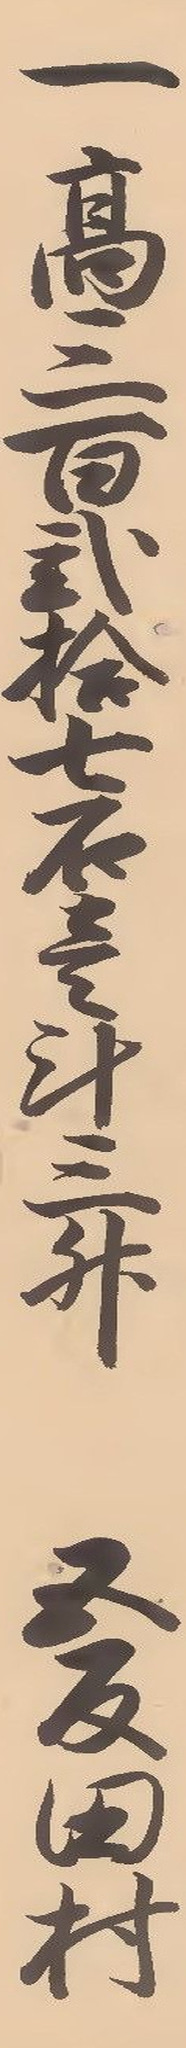一高三百弐拾七石壱斗三升五反田村

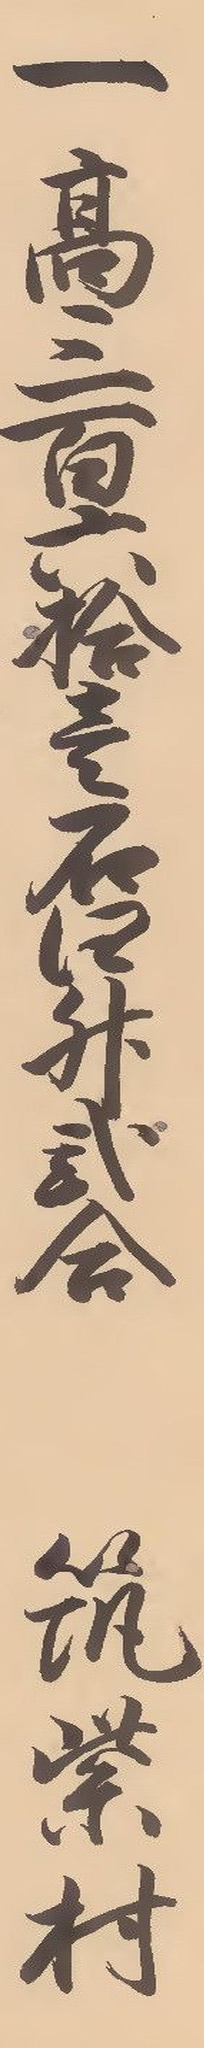一高三百六拾壱石四升弐合筑紫村
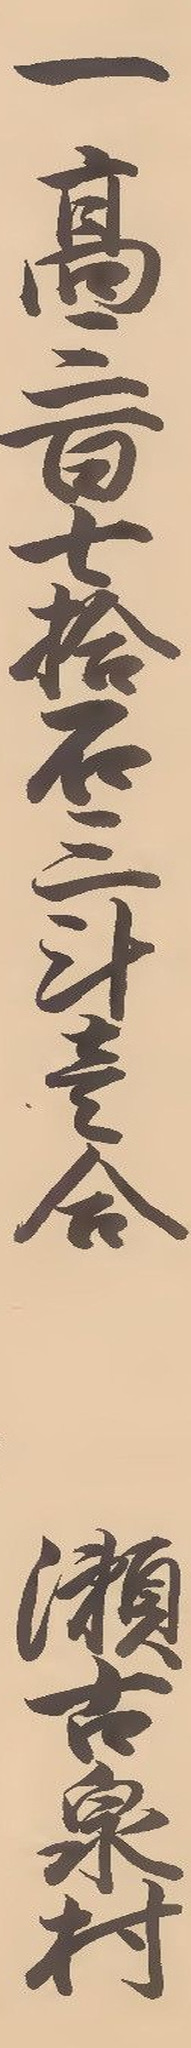一高三百七拾石三斗壱合瀬古泉村
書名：伊勢国郷帳
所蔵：国立公文書館 National Archives of Japan
